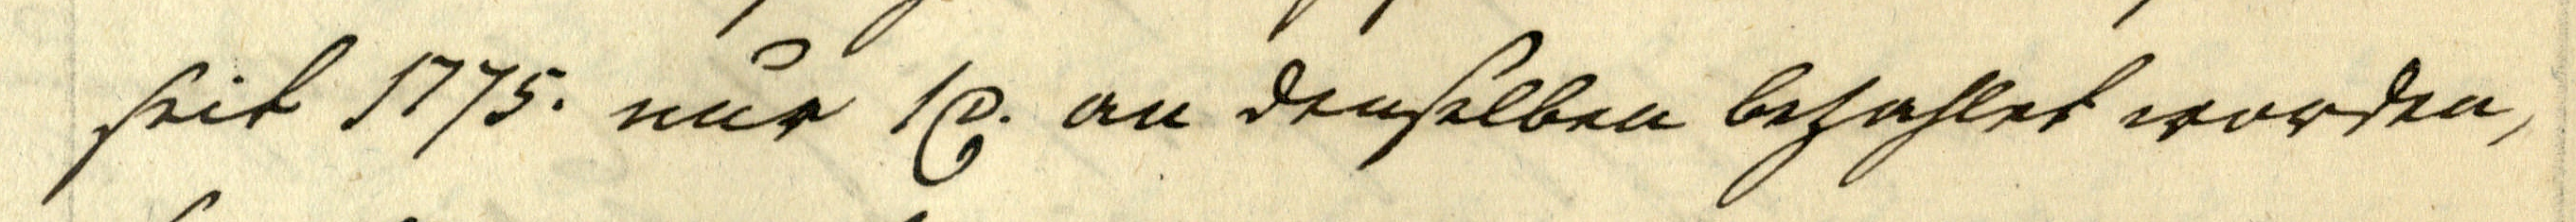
seit 1775. nur 1. l. denselben bezahlet worden,
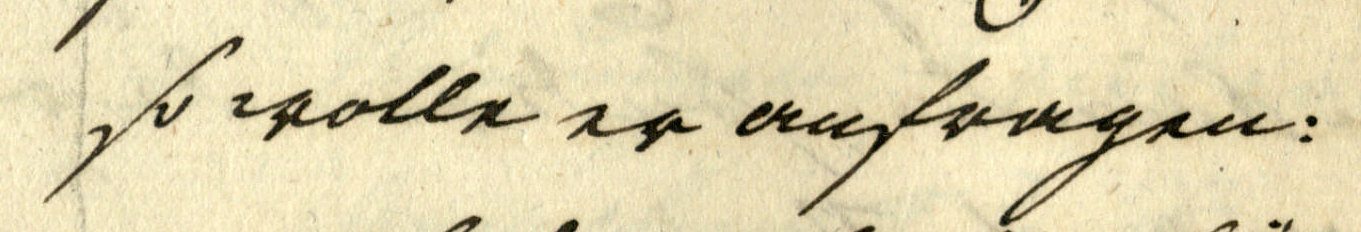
so wolle er anfragen:
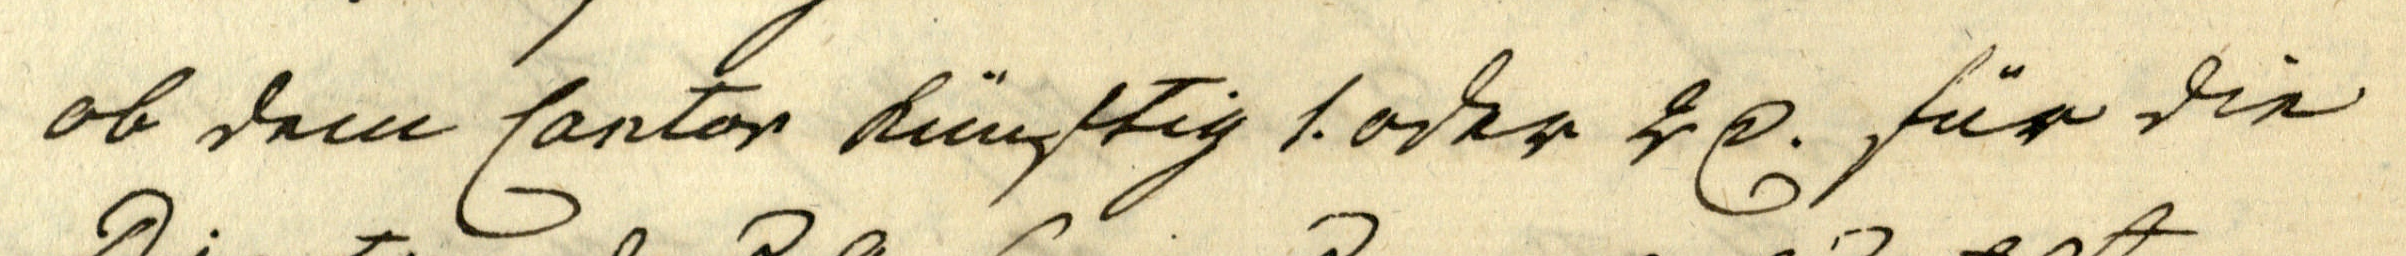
ob dem Cantor künftig 1. oder 2 l. für die
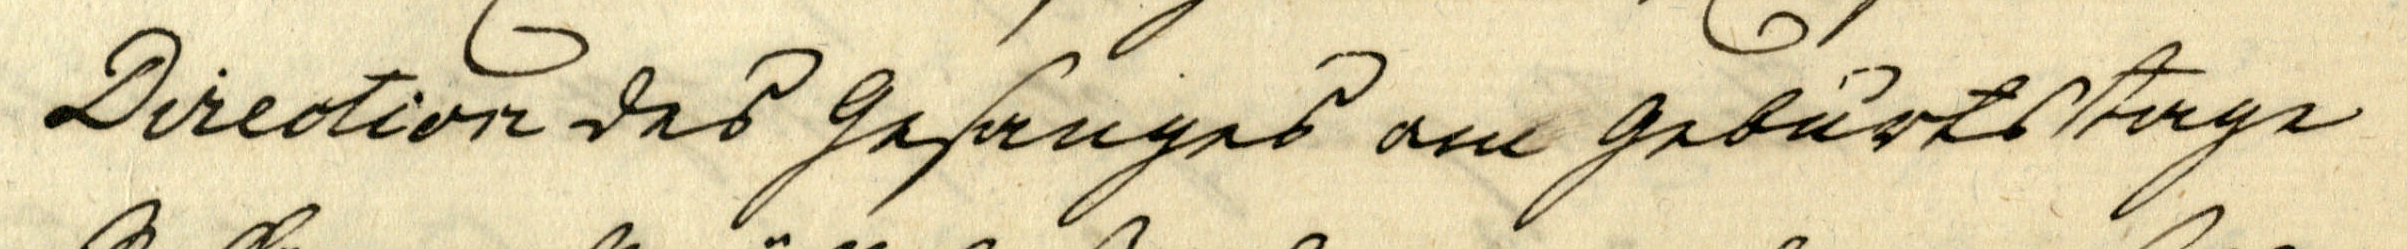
Direction des Gesanges am Geburtstage
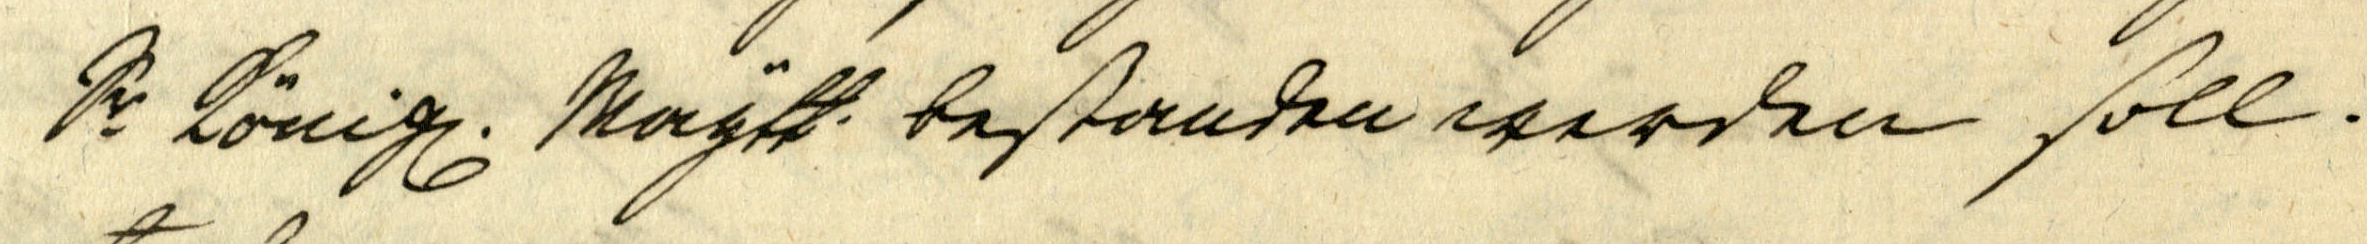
Sr Königl. Maÿtt. bestanden werden soll¬
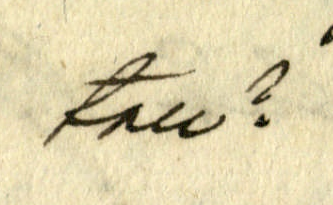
ten?
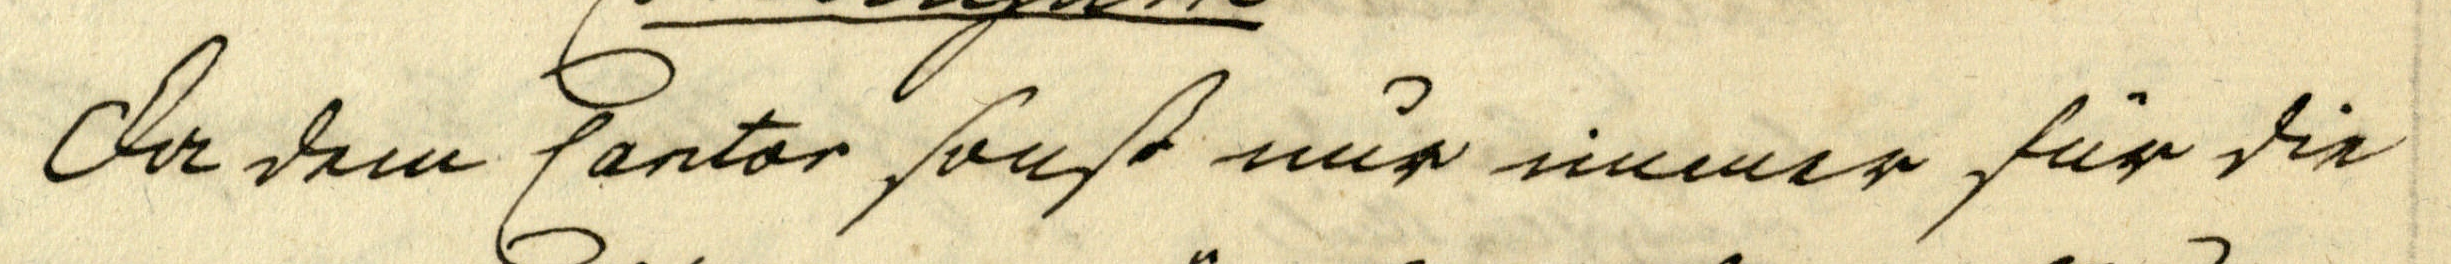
Da dem Rantor sonst nur immer für die
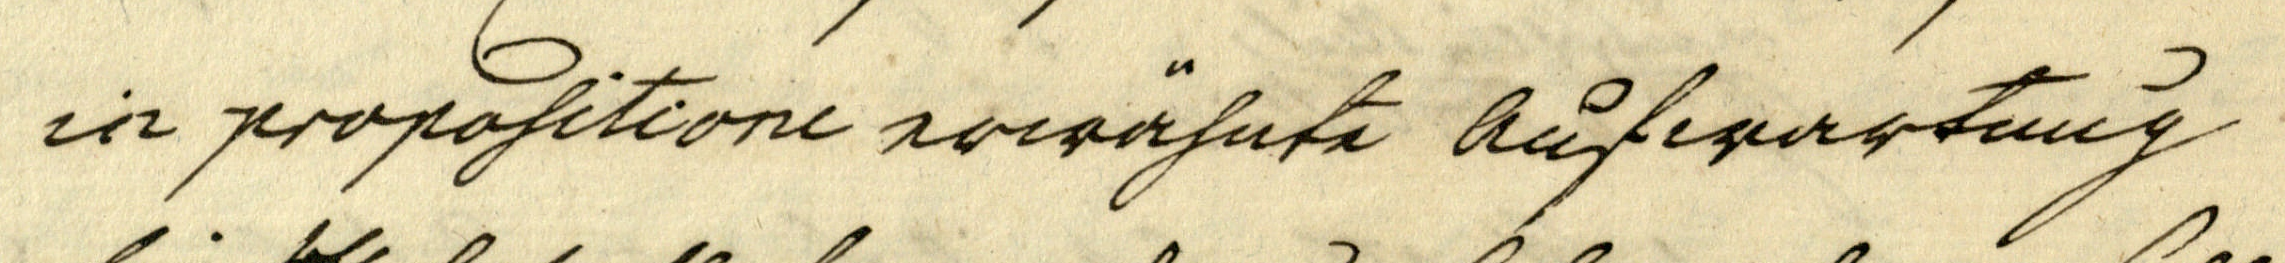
in propositione erwähnte Aufwartung
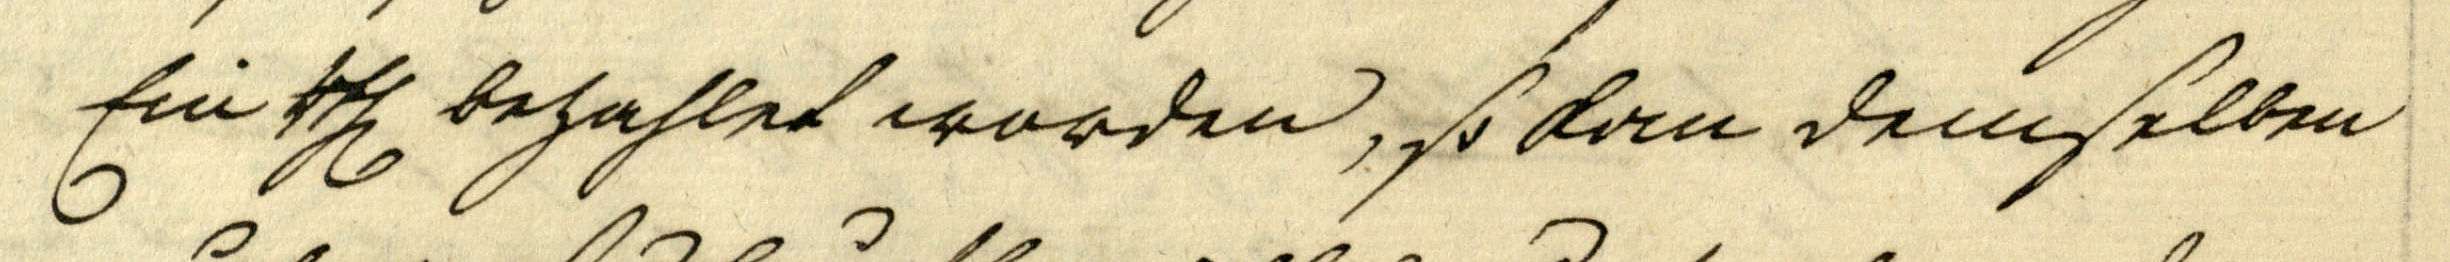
Ein rth bezahlet worden, so kan demselben
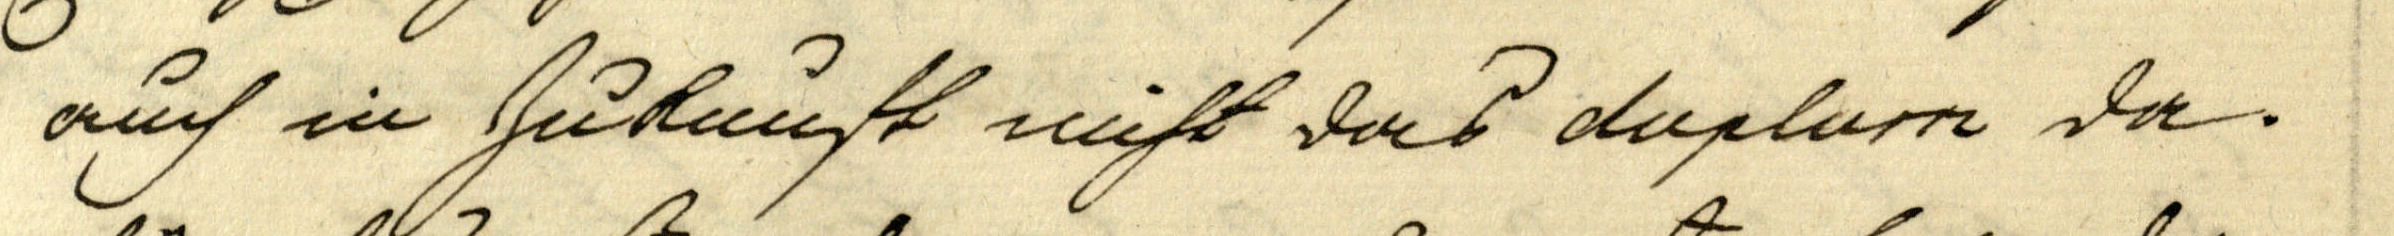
auch in Zukunft nicht das duplum da¬
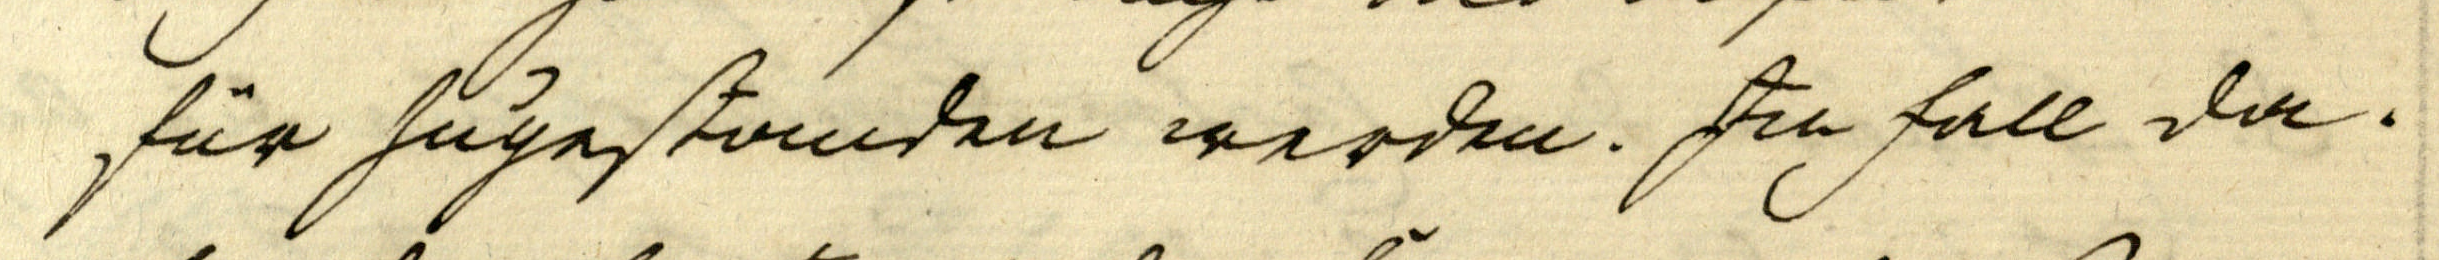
für zugestanden werden. Im Fall da¬
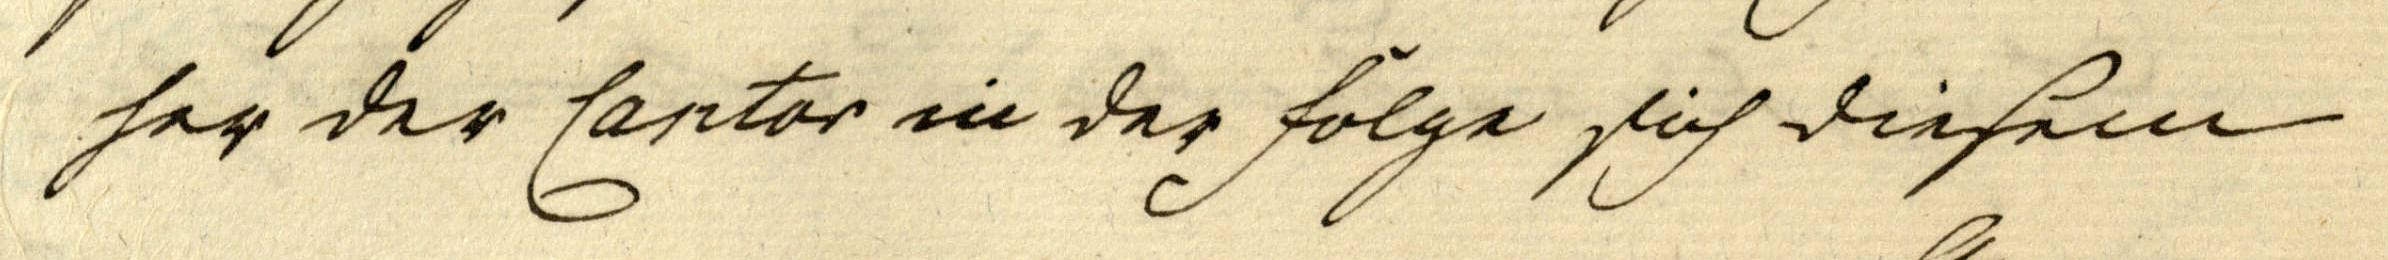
her der Cantor in der Folge sich diesem
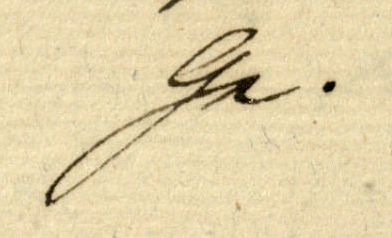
Ge-
